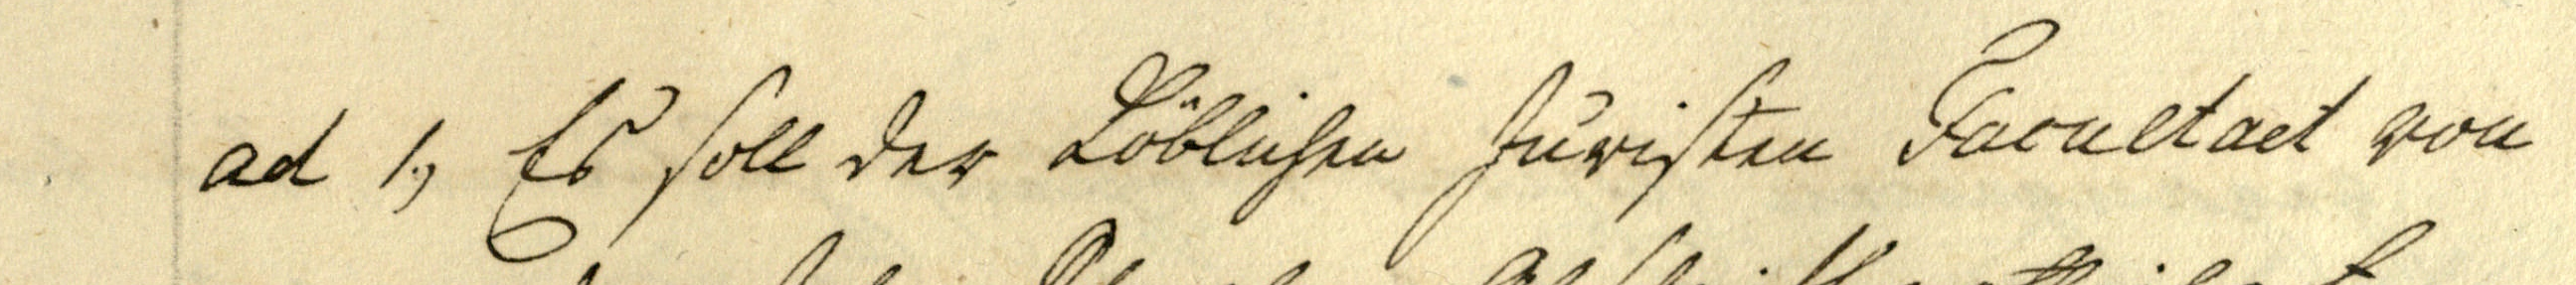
ad 1, Es soll der Löblichen Juristen Facultaet von
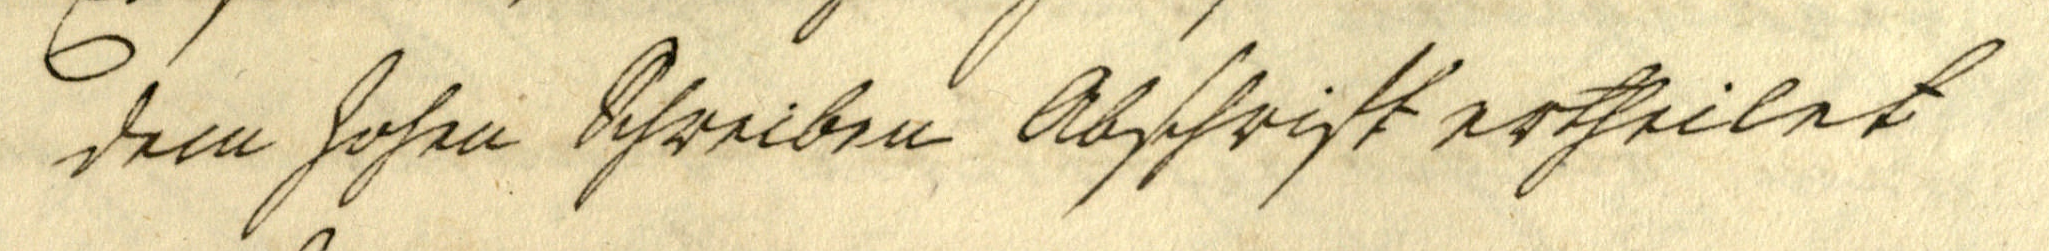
dem hohen Schreiben Abschrift ertheilet
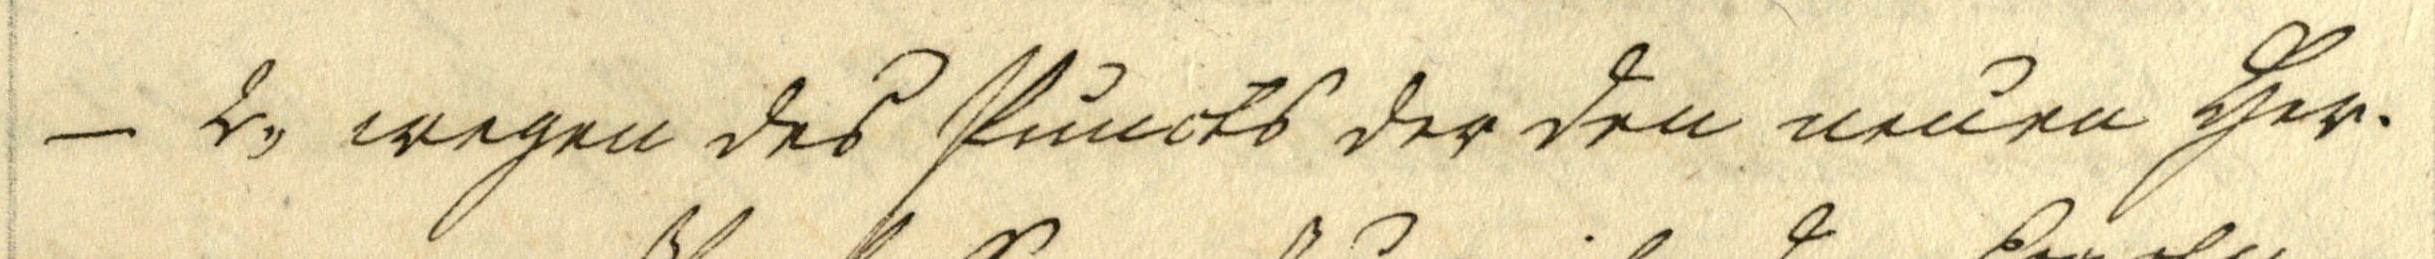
2. wegen des Puncts der den neuen Her¬
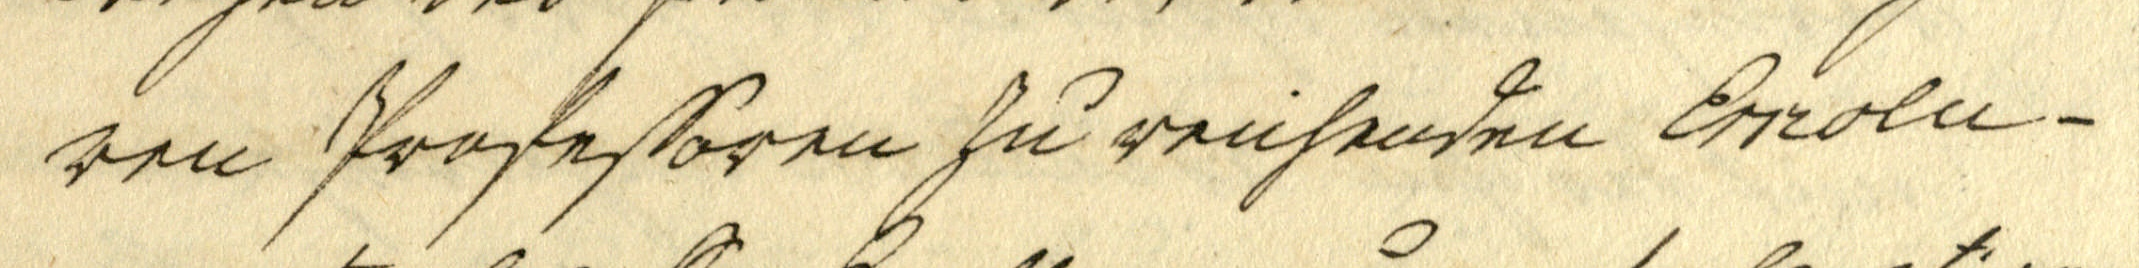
ren Professoren zu reichenden Emolu-
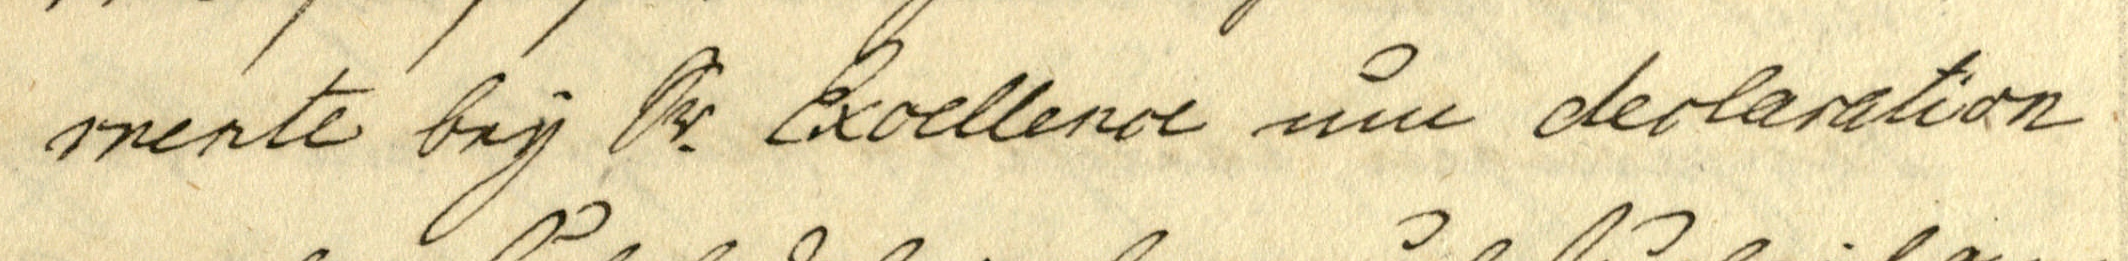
ente beÿ Sr Excellence um declaration
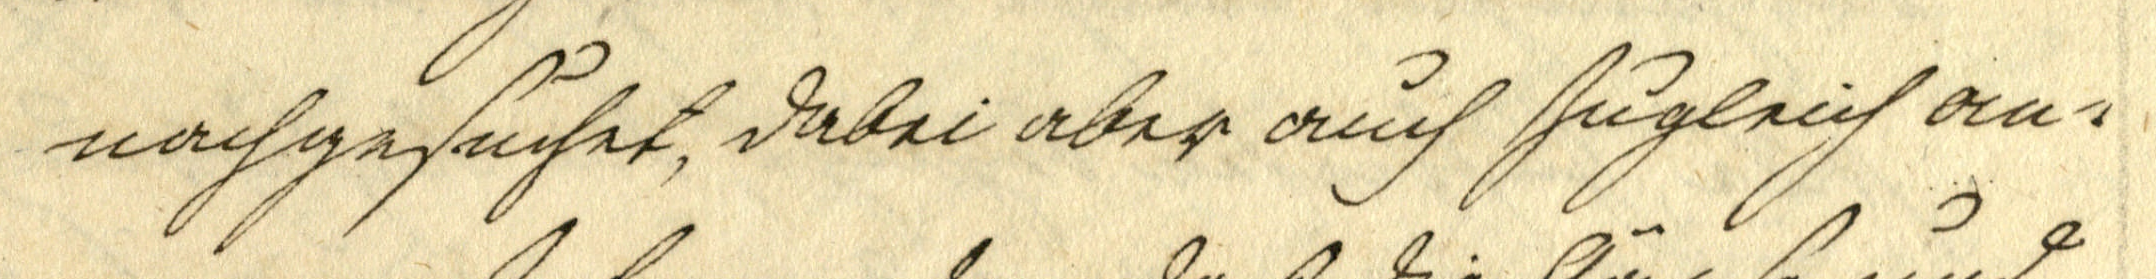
nachgesuchet, dabei aber auch zugleich an¬
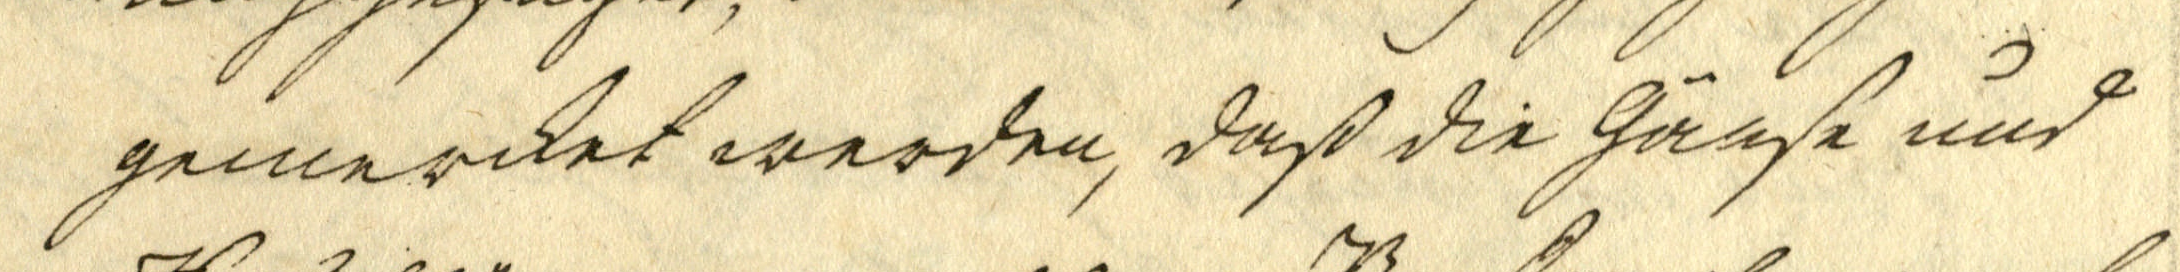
gemercket werden, daß die Gänse und
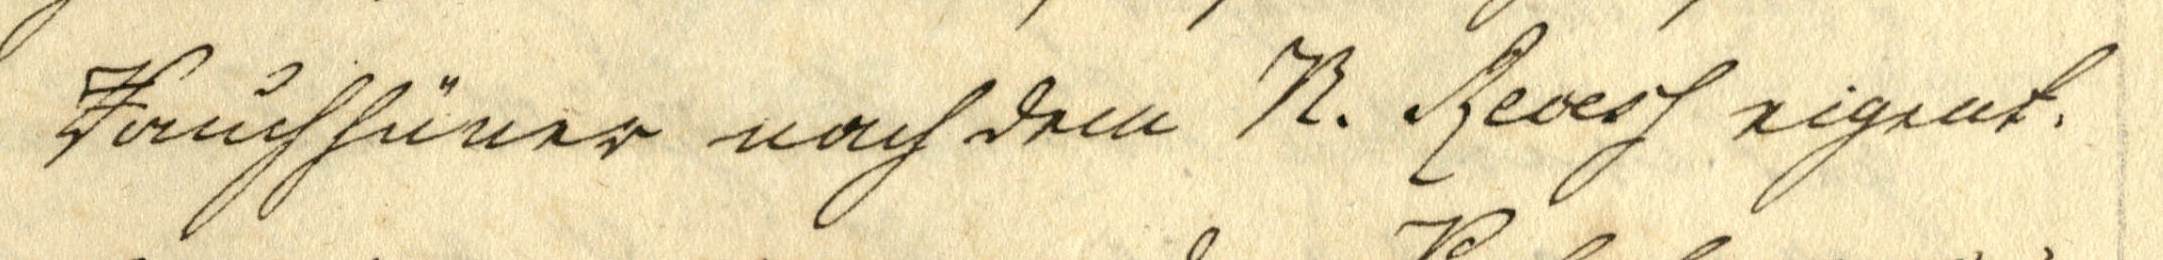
Rauchhüner nach dem N. Recess eigent¬
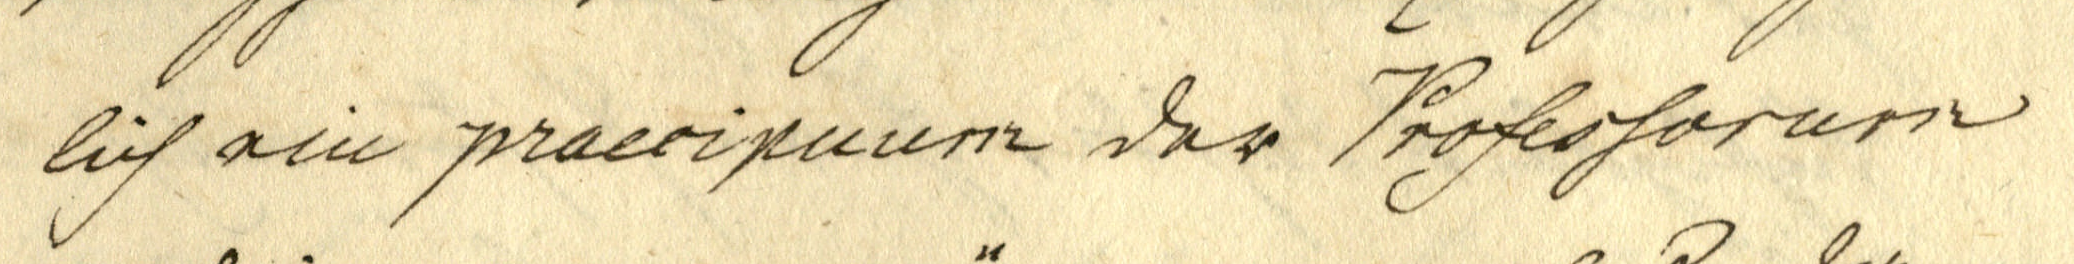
lich ein praecipuum der Professorum
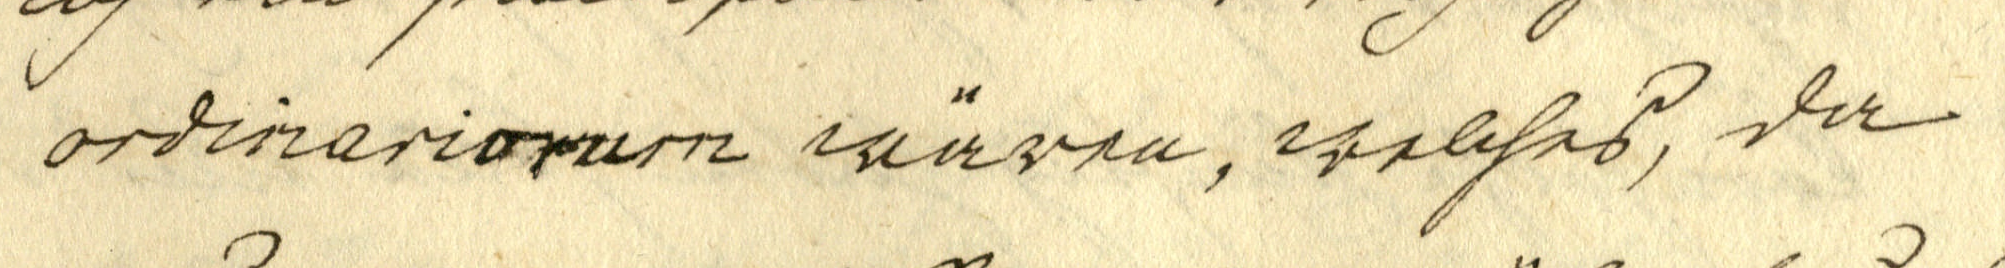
ordinariorum wären, welches, da
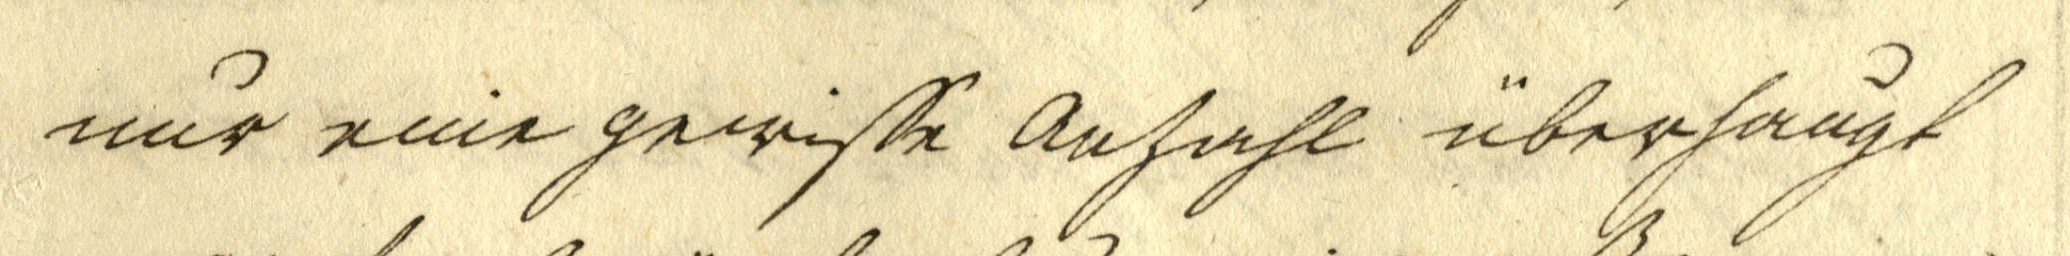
nur eine gewisse Anzahl überhaupt
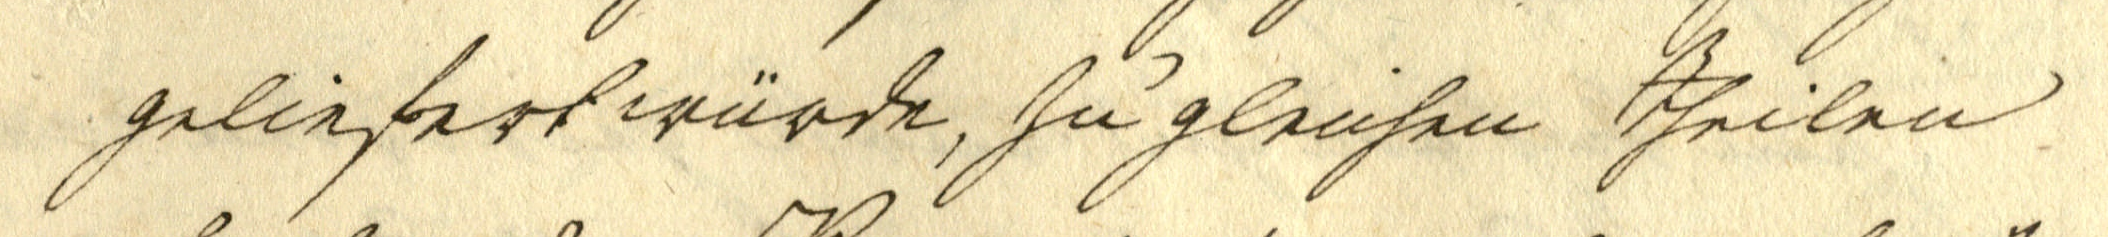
geliefert würde, zu gleichen Theilen
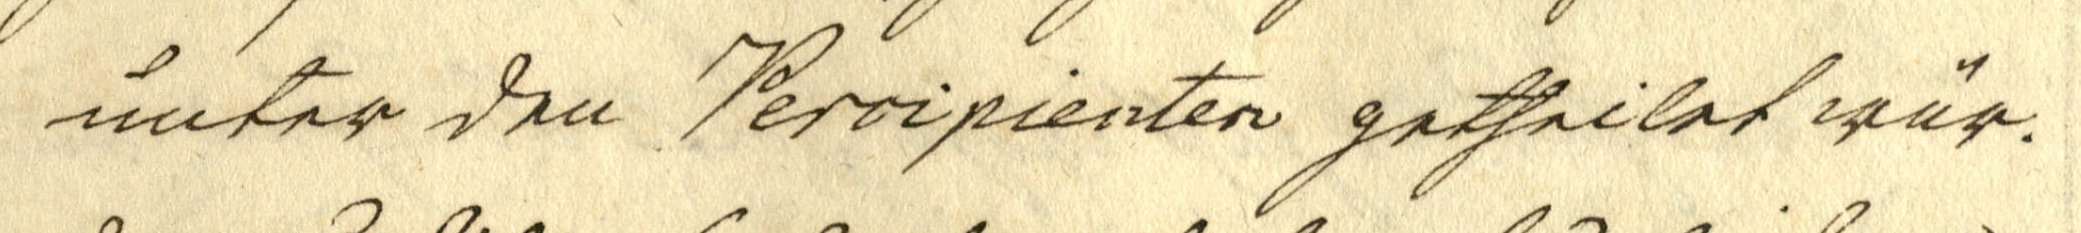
unter den Percipienten getheilet wür-
